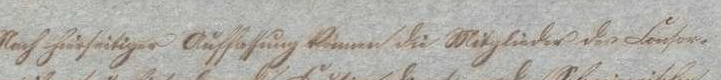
Nach hierseitiger Auffassung können die Mitglieder des Consor-
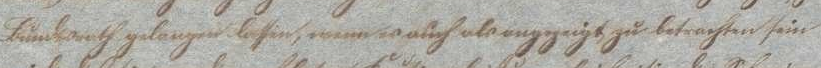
Bundesrath gelangen lassen, wenn es auch als angezeigt zu betrachten sein
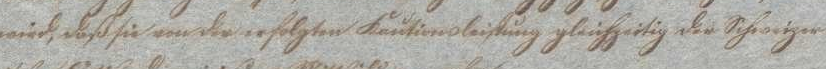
wird, daß sie von der erfolgten Kautionsleistung gleichzeitig der Schweizer-
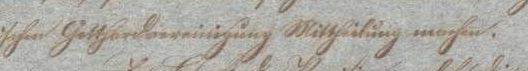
ischen Gotthardvereinigung Mittheilung machen.
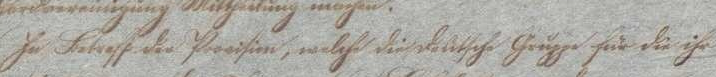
In Betreff der Provision, welche die deutsche Gruppe für die ihr
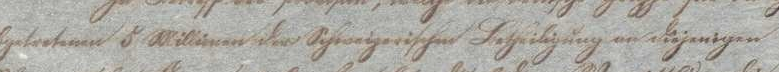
abgetretenen 5 Millionen der Schweizerischen Betheiligung an diejenigen
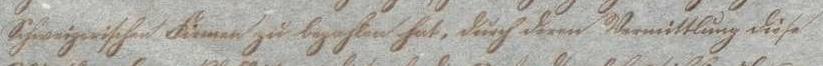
Schweizerischen Firmen zu bezahlen hat, durch deren Vermittlung diese
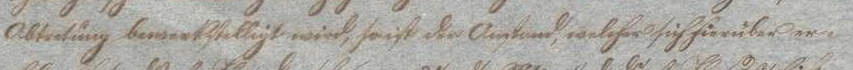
Abtretung bewerkstelligt wird, so ist der Anstand, welcher sich hierüber er-
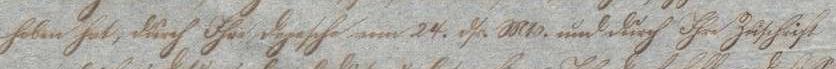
hoben hat, durch Ihre Depesche vom 24. dss Mts. und durch Ihre Zuschrift
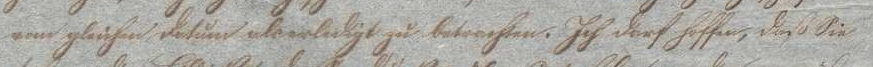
vom gleichen Datum als erledigt zu betrachten. Ich darf hoffen, daß Sie
